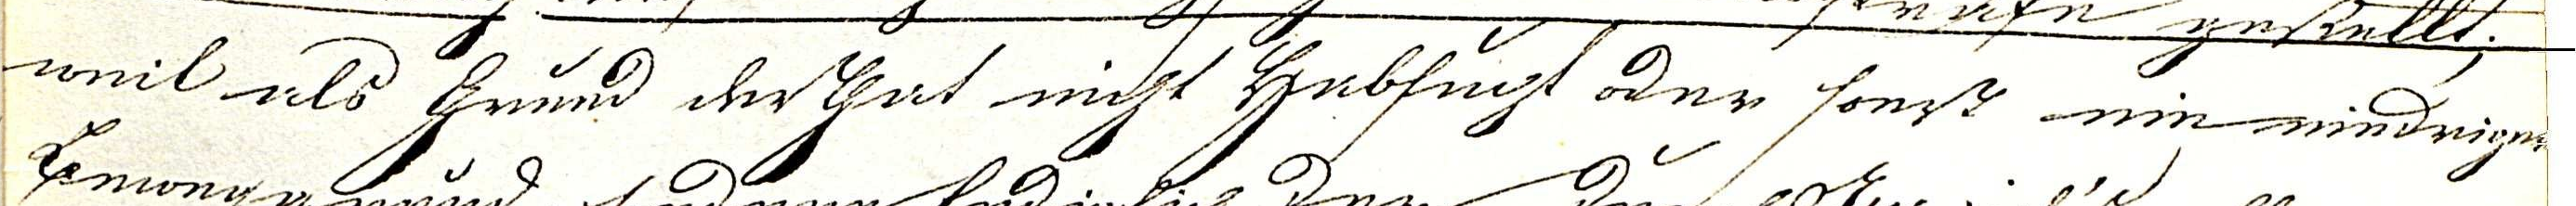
weil als Grund der hat nicht Habsucht der sonst ein eindringe
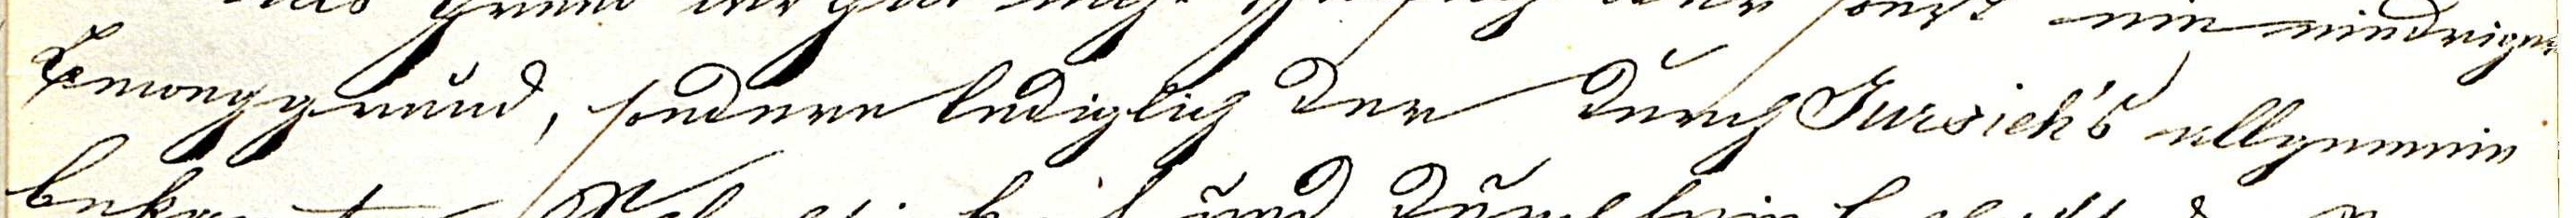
Beweggrund, sondern lediglich der durch Jursich's allgemein
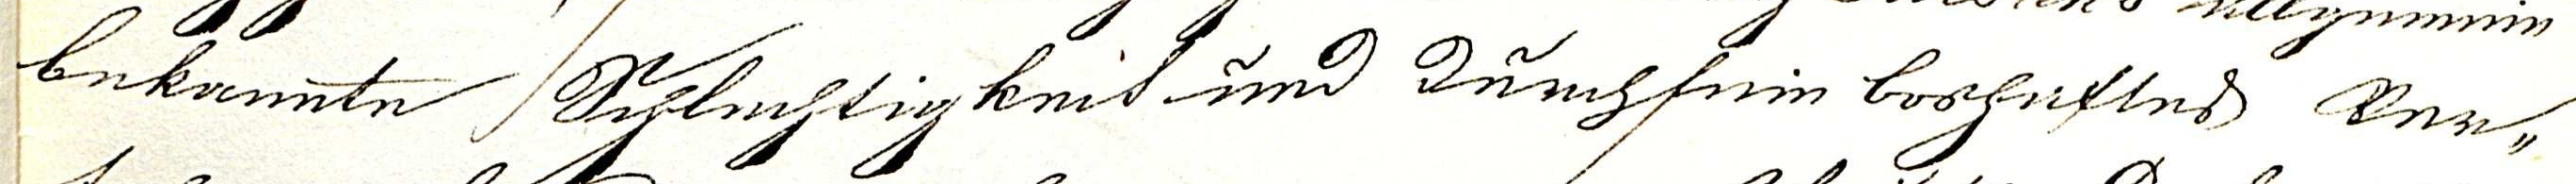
bekannte Schlechtigkeit und durch sein boshaftes Ver¬
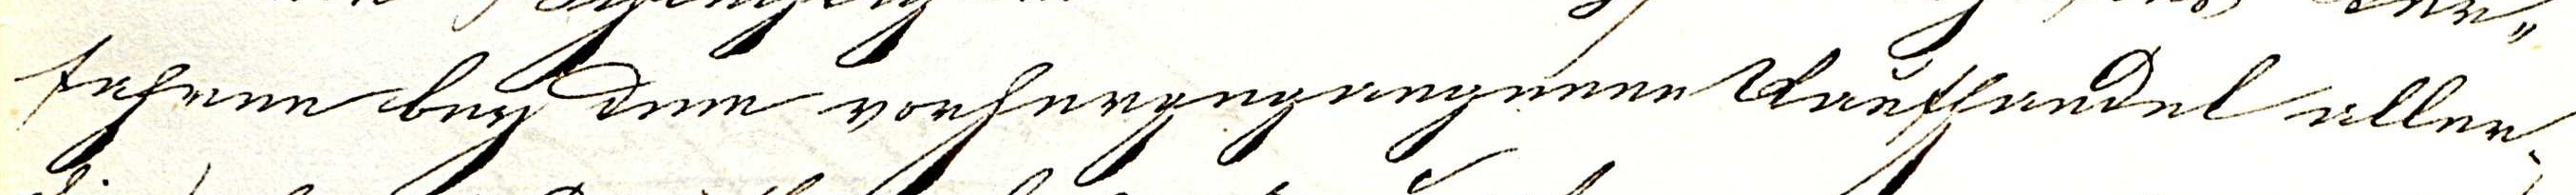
fahren bey dem vorhergegangener Raufhandel aller¬
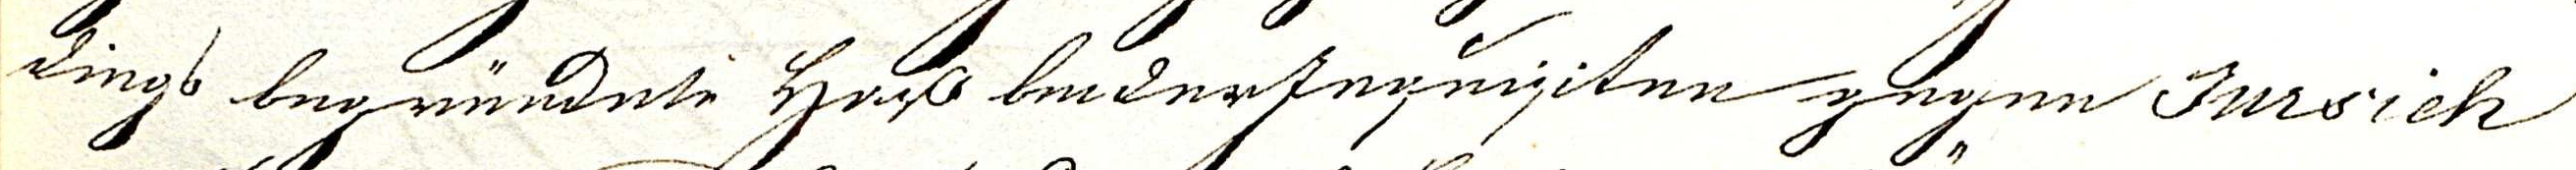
dings begründete Hauß beider Inquisiten gegen Jursich
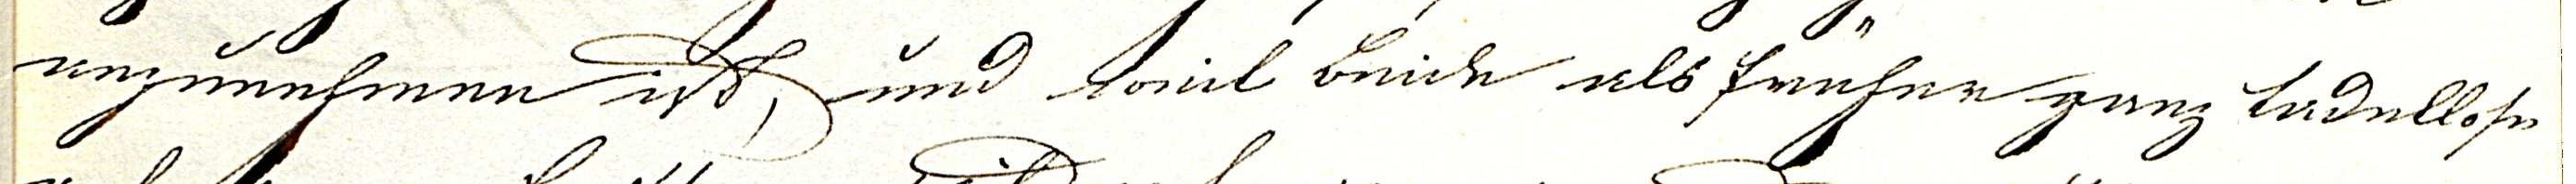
anzunehmen ist, und weil beide als früher ganz tadellose
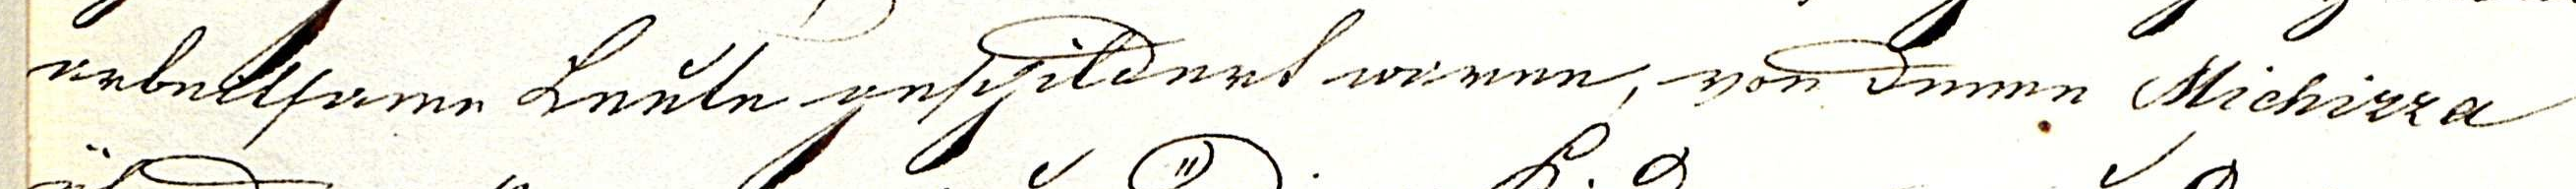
arbeitsame Leute geschildert waren, von denen Michizza
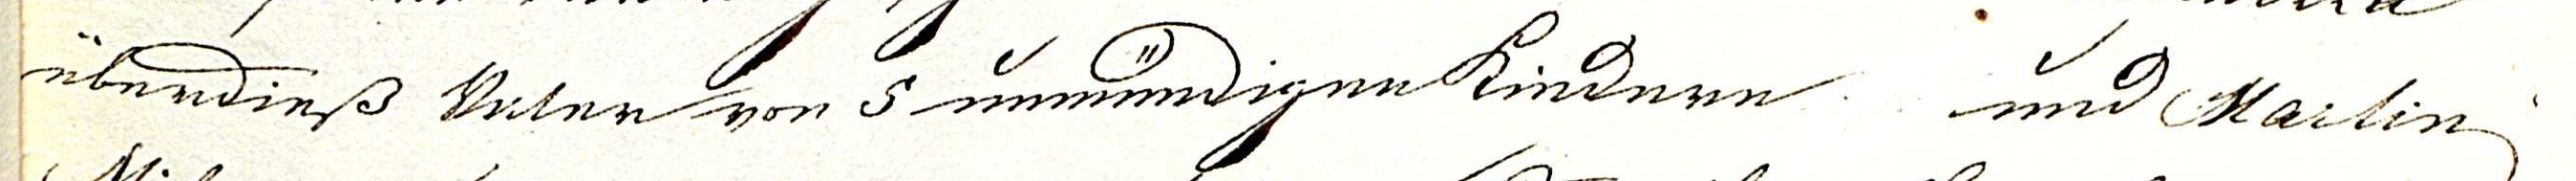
überdieß Vater von 5 unmündiger Kindern und Martin
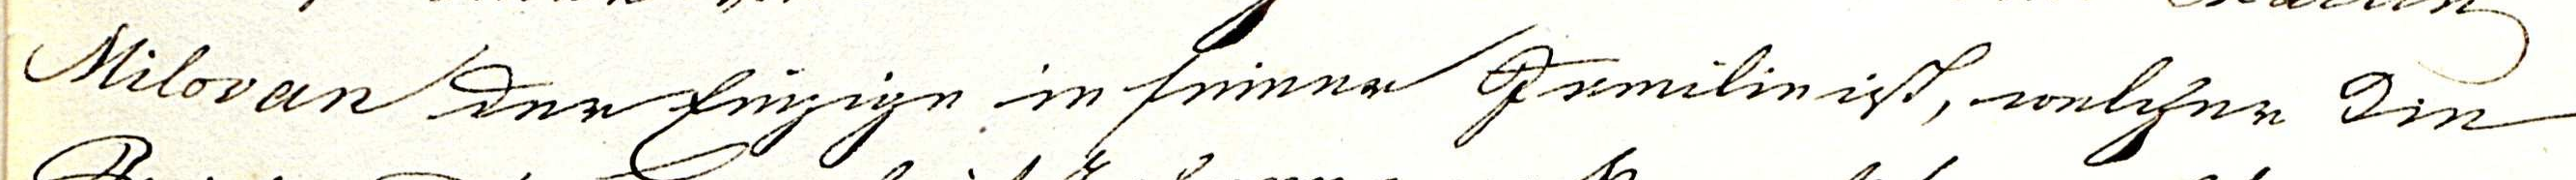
Milovan der Einzige in seiner Familie ist, welcher die
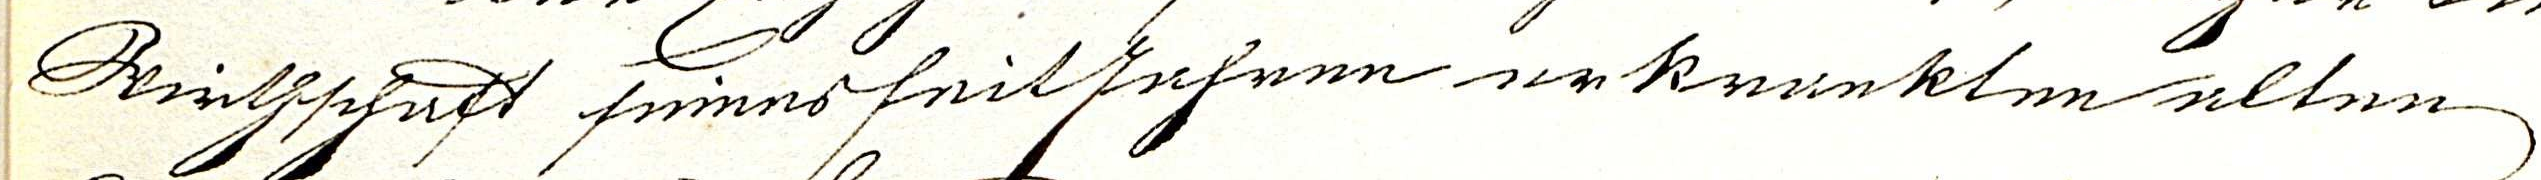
Wirtschaft seines seit Jahren er krankten alten
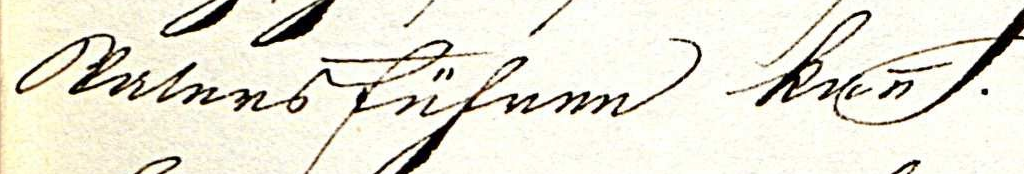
Raters führen kann.
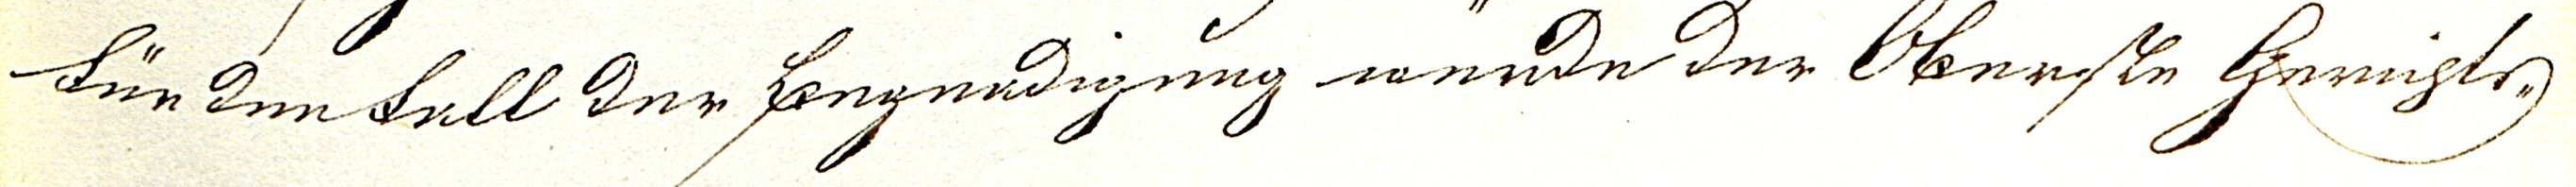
Für den Fall der Begnadigung würde der Oberste Gerichts¬
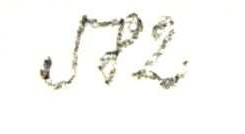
582
